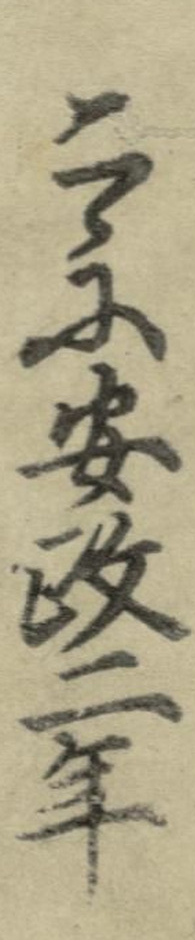こゝに安政二年
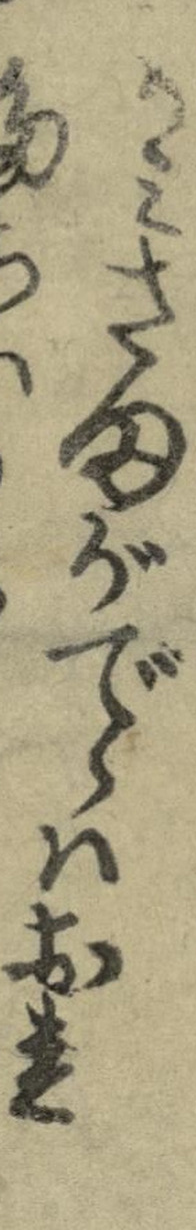〽かみさまがでゝはおれ
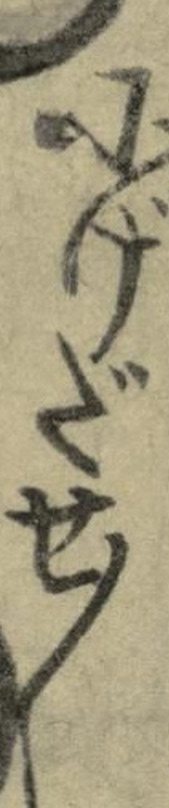にげだせ〳〵
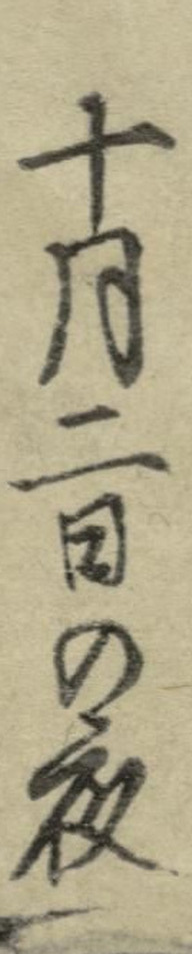十月二日の夜
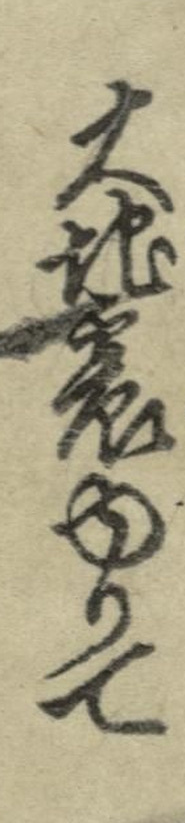大地震ゆりて
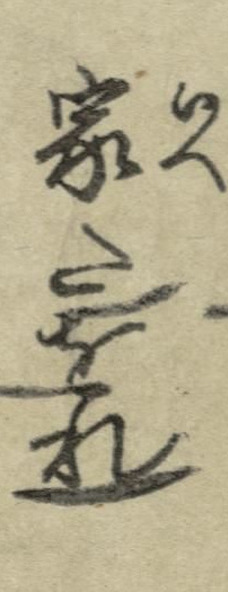家たをれ
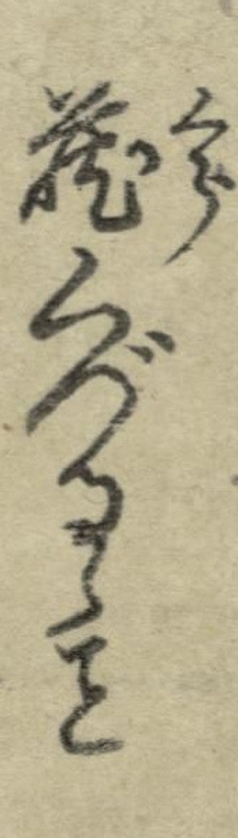藏くづるゝこと
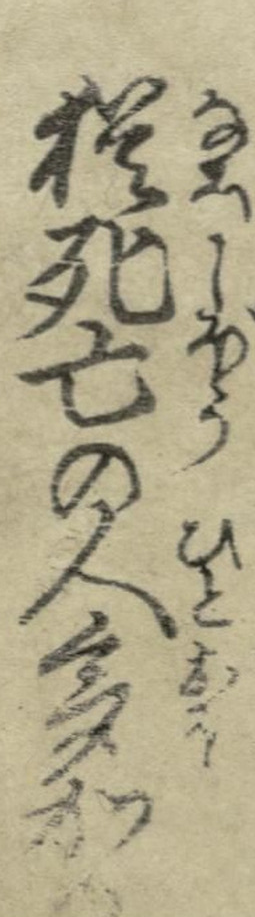猶死亡の人多かる
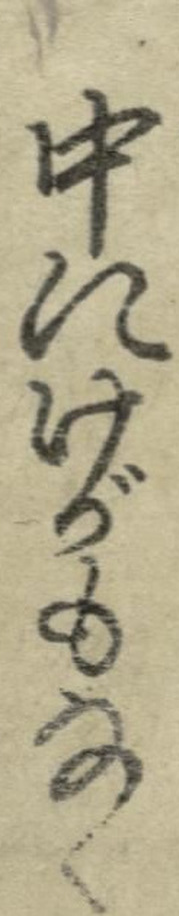中にけがもなく
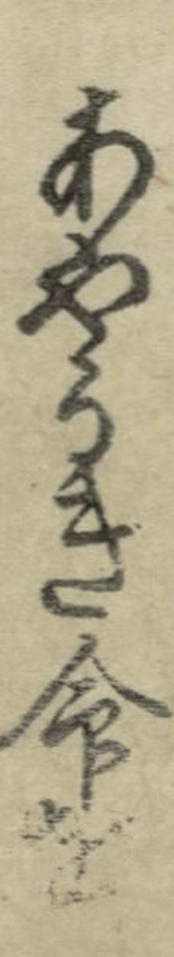あやうき命を
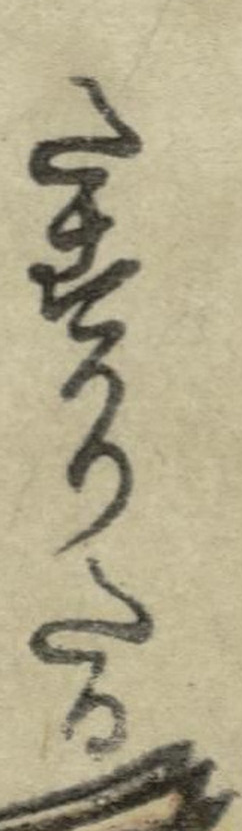たすかりたる
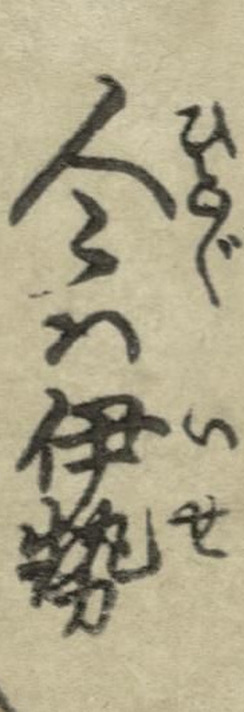人〻は伊勢
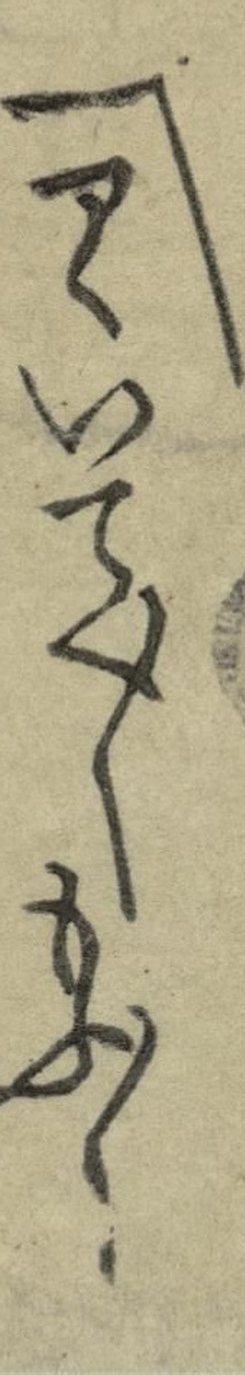〽アゝいてへ〳〵もふ〳〵
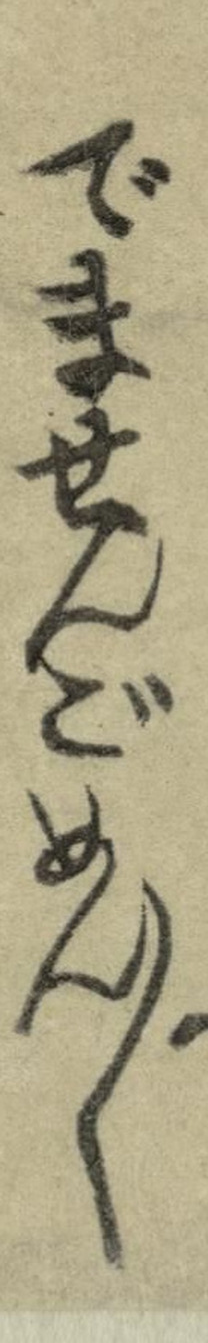でませんごめん〳〵
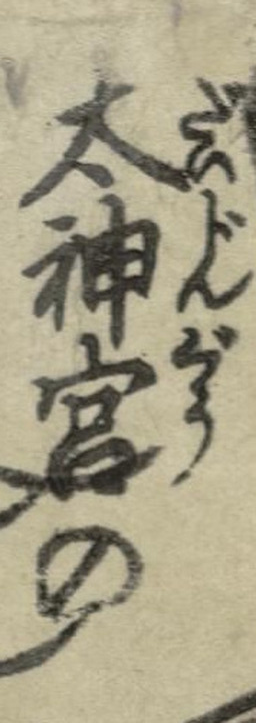太神宮の
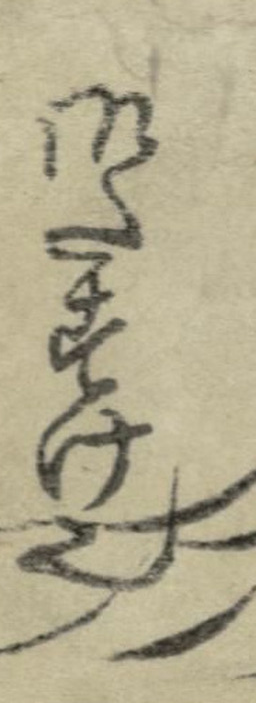御たすけ也
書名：[鯰をけちらす伊勢神宮・神馬]
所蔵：東京大学地震研究所図書室 Earthquake Research Institute Library, The University of Tokyo, JAPAN
